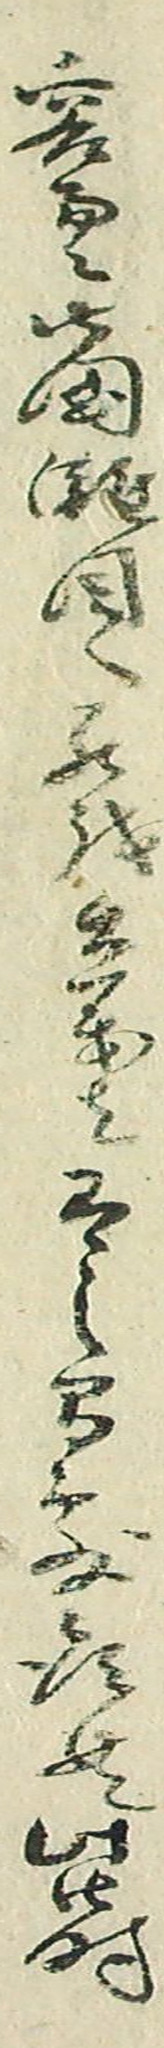容易に御国灘目へ罷越候義は有之間敷候得共此御時
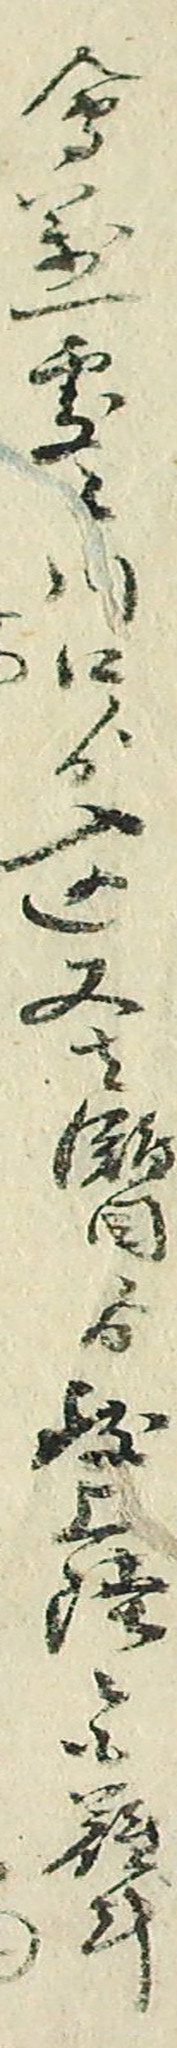会万一処々川口ゟ入込又は灘目ゟ致上陸候も難計
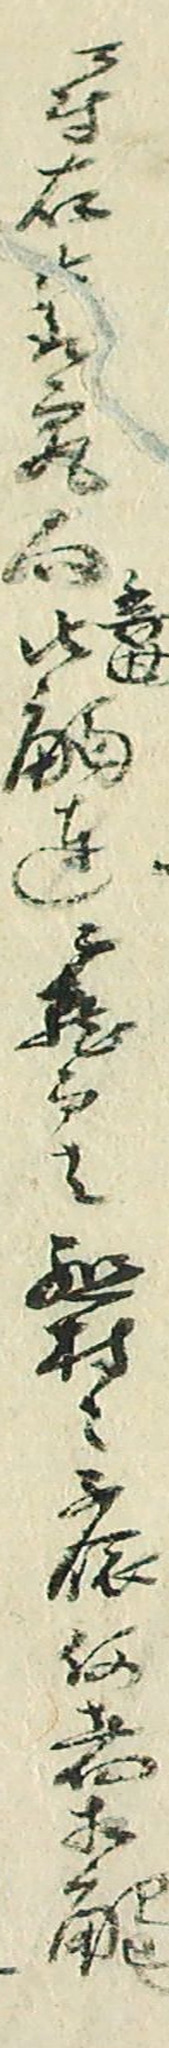に付右御取究向委曲御触達に就而は組村々不依何者相触
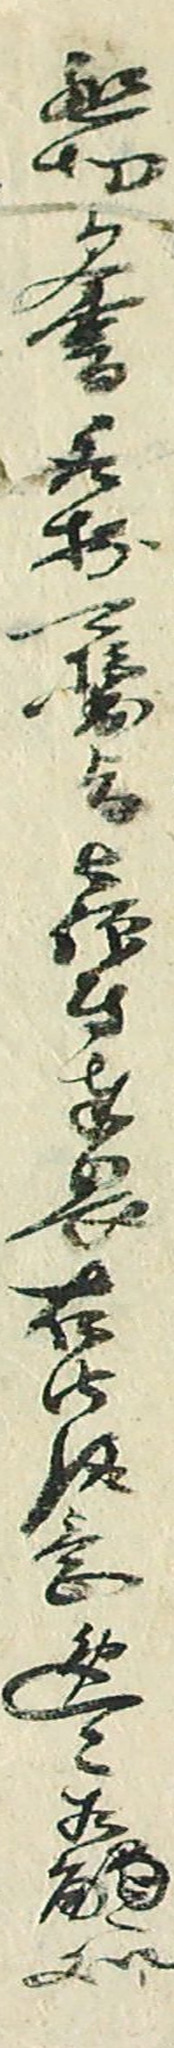組切受書取揃可指出旨被仰付奉畏右御趣意逸々相触候処
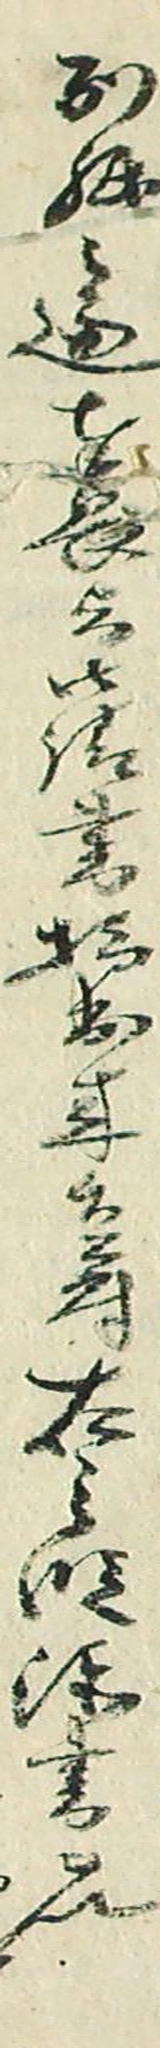別紙之通奉畏旨御請書指出来候に付右之段添書を以
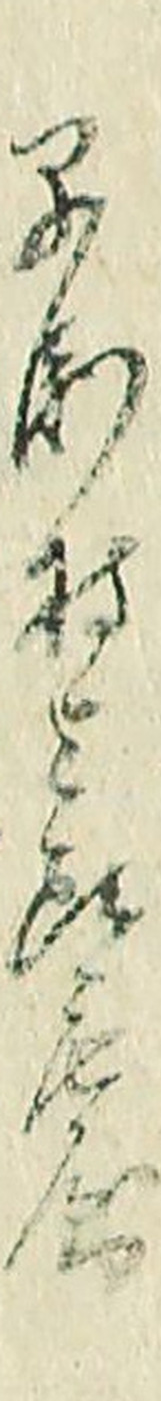早渕村与頭庄屋
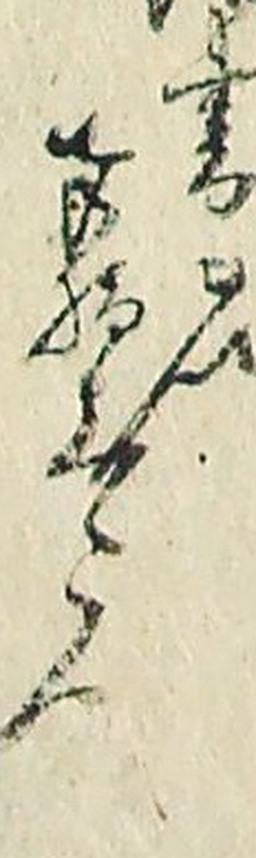奉指上候以上
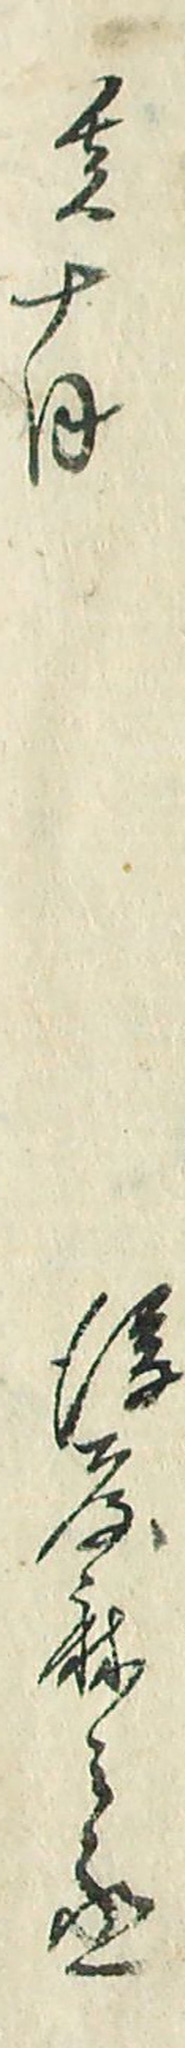亥十月後藤麻之丞
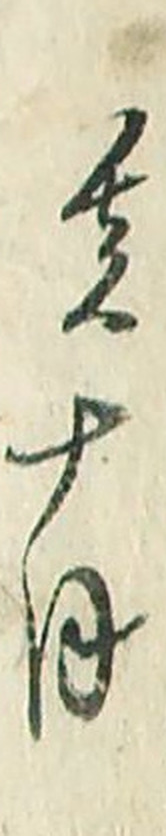亥十月
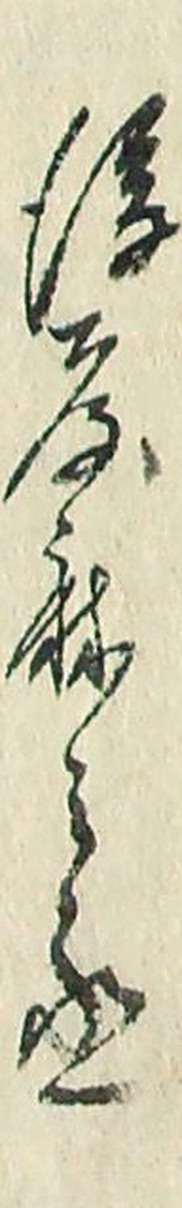後藤麻之丞

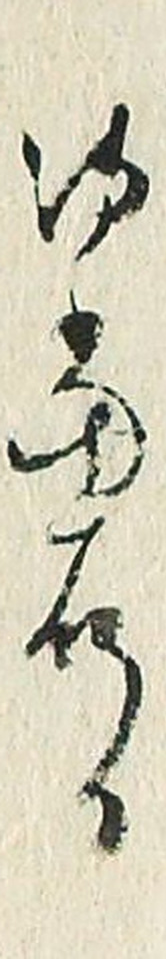御当右同
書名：諸御用御□受書控
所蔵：鳴門教育大学 Naruto University of Education
